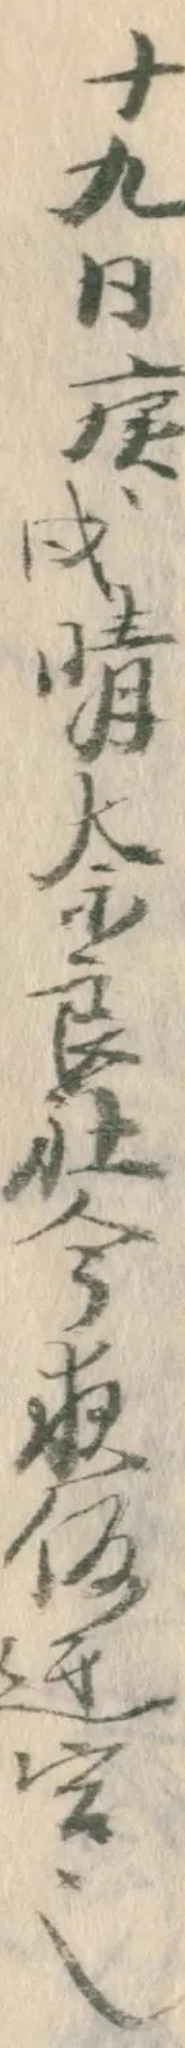十九日庚戌晴奈良社今夜仮遷宮也
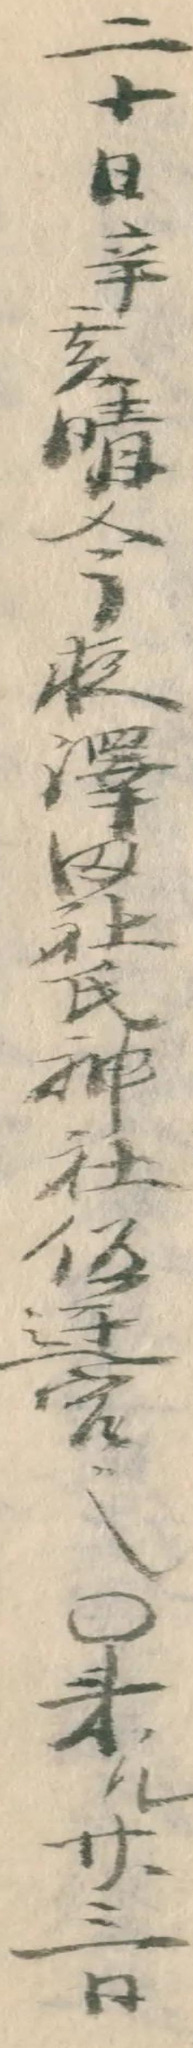二十日辛亥晴今日夜澤田社氏神社仮遷宮也〇来ル廿三日
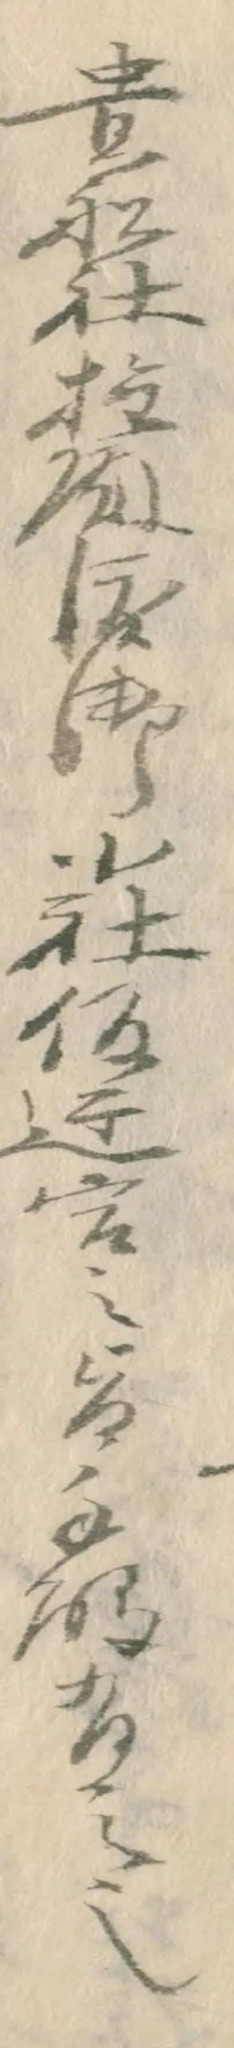貴船社権殿渡御小社仮遷宮之旨手觸有之也
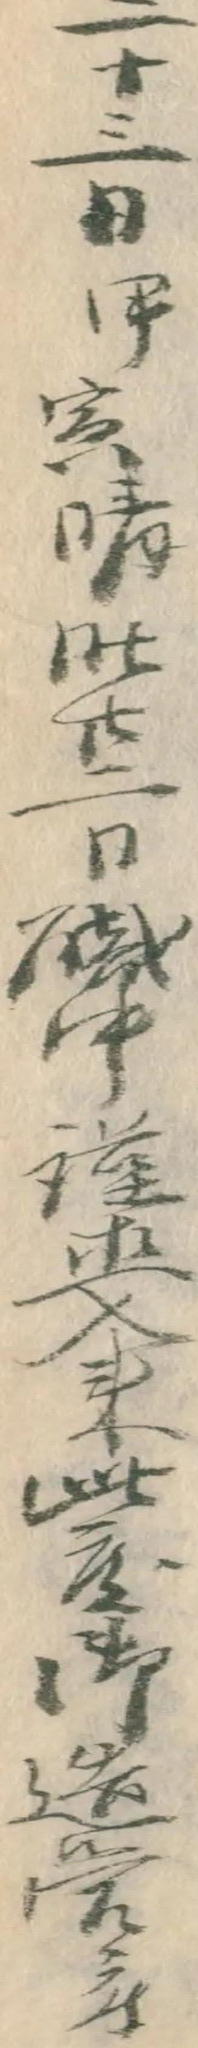二十三日甲寅晴昨廿二日職中謹直入来此度御造営ニ付

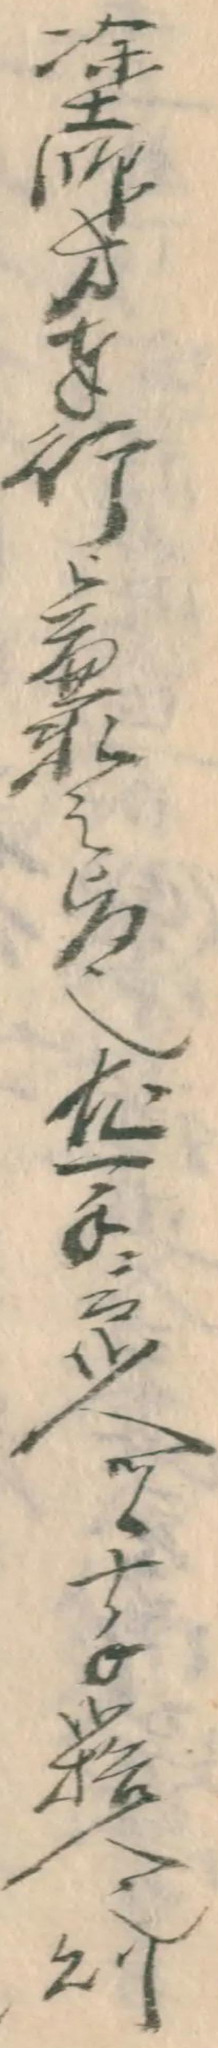塗師方奉行被兼頼之旨也左一手ニ而弐人ツヽ十千弐拾人也則
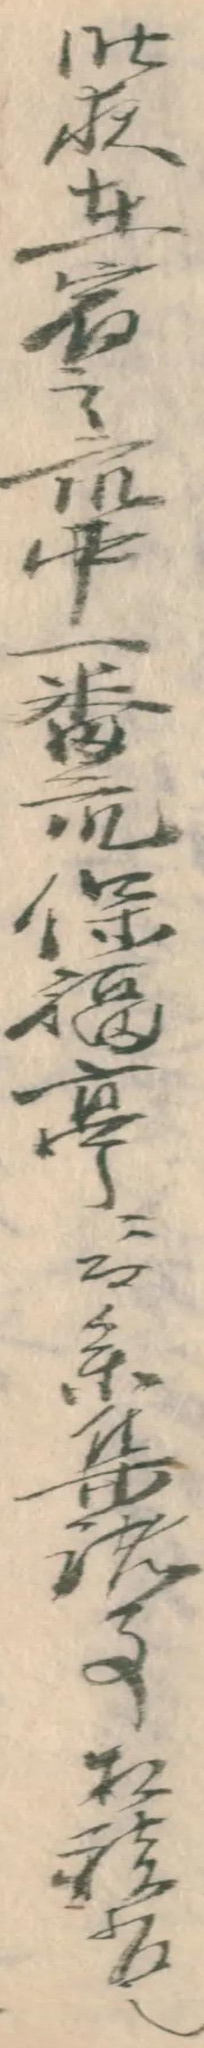昨夜在宿之衆中一番衆保福亭ニ而参集諸事相談有也
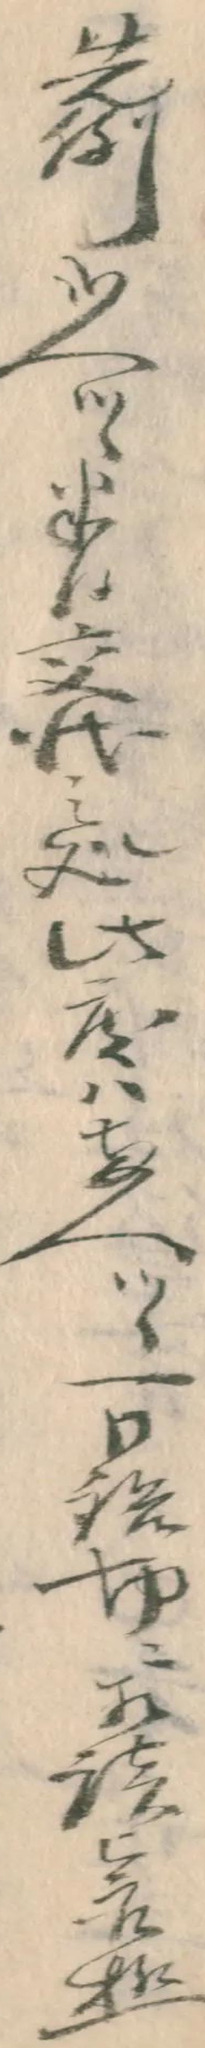先例弐人ツヽ半日交代之処此度ハ両人ツヽ一日詰切ニ相談被取
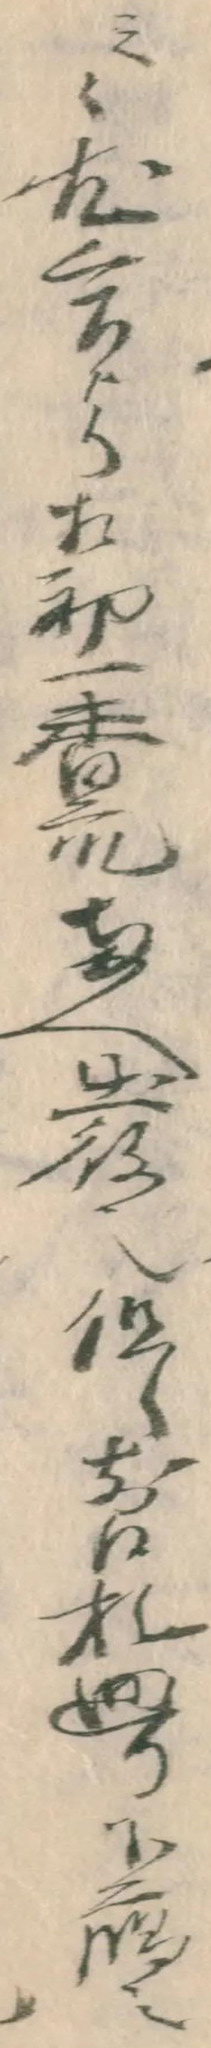云〻尤今日より相初一番衆両人出役也但し前日札廻り下臈之
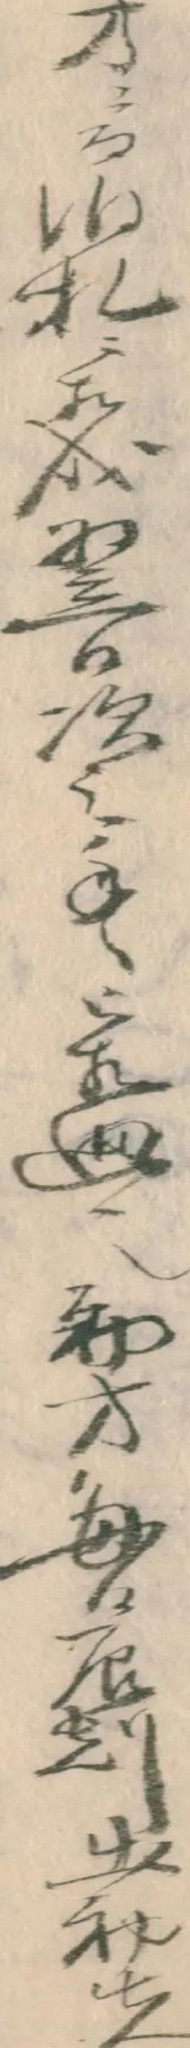方ニ而泊札ニ相成翌日次之手へ被相廻也勤方毎日辰刻出勤先
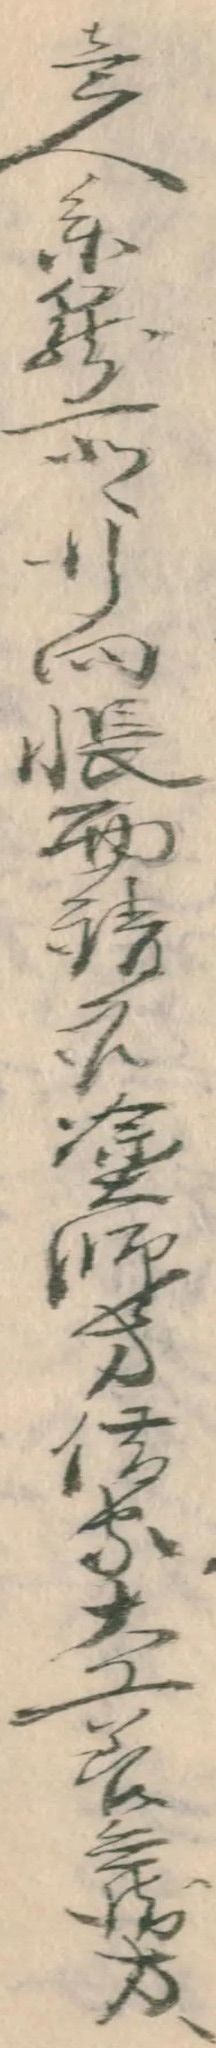壱人参籠所へ引向帳面請取塗師方借家大工善兵衛方へ
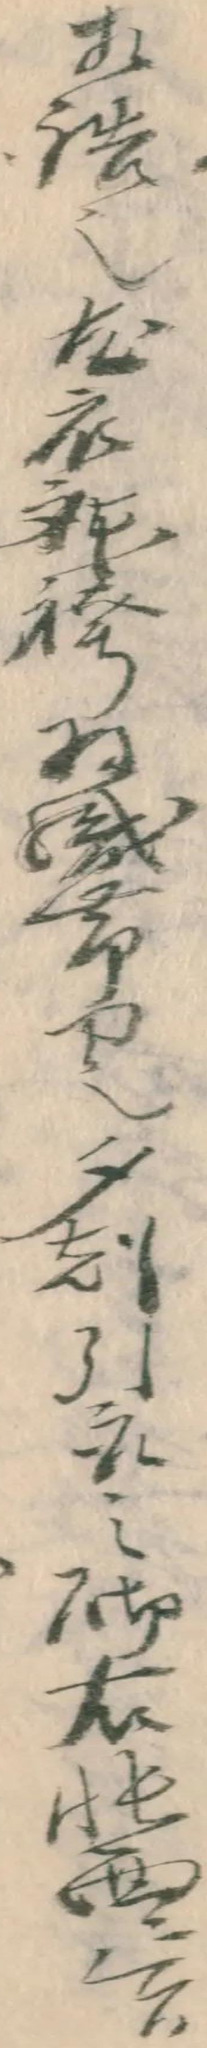相詰之尤衣躰袴羽織帯刀也夕刻引取之砌右帳面ニ今日
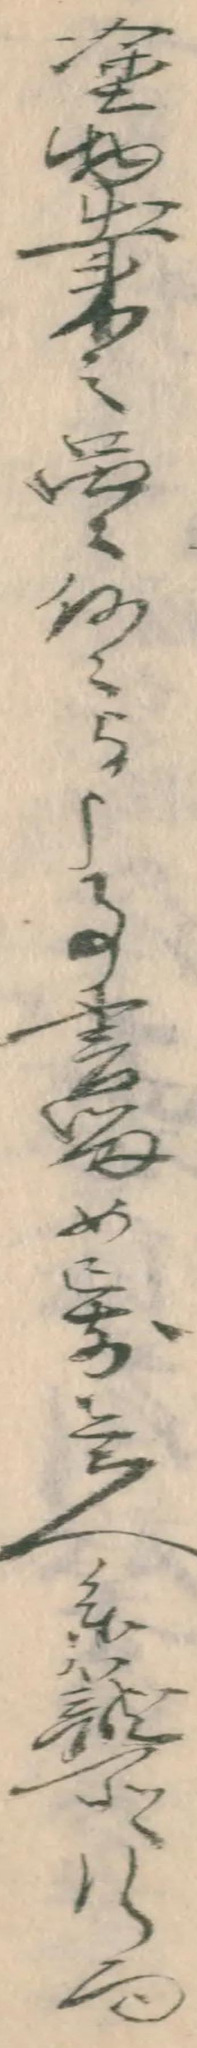塗物出来之品々何々と申事書留如已前壱人参籠所へ行向
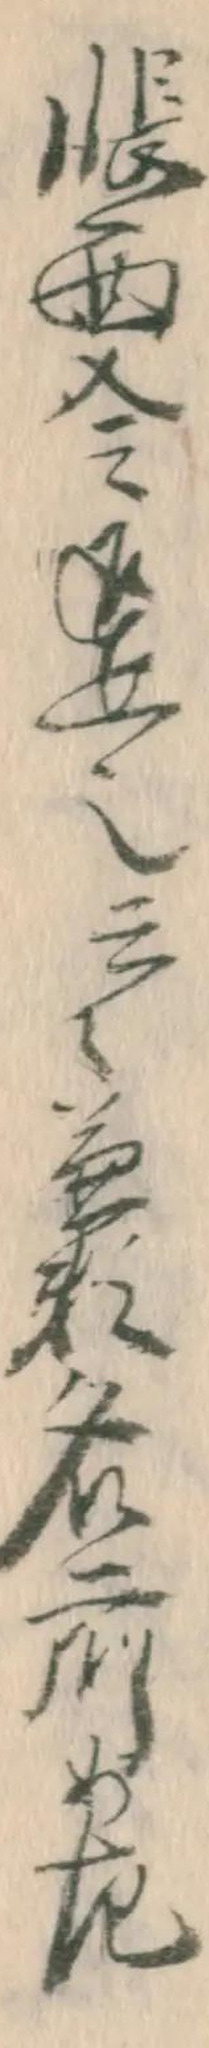帳面令塗也云々兼頼名前如左
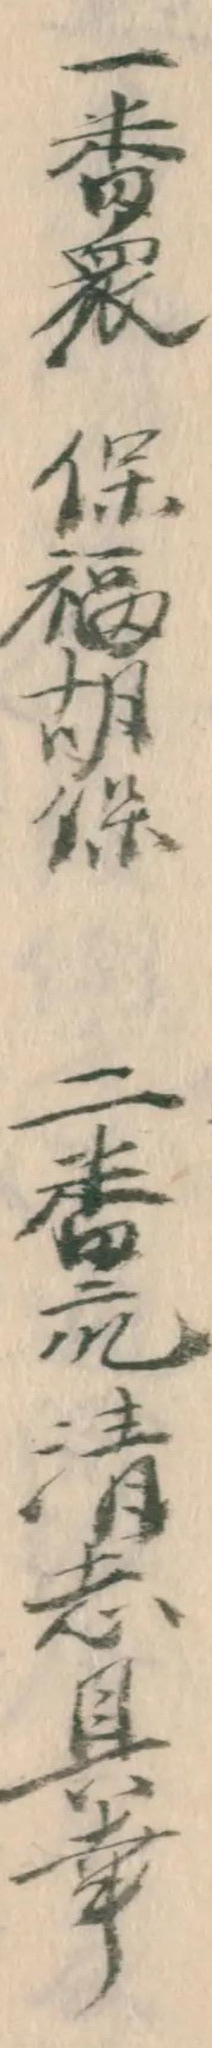一番衆保福胡保二番衆清志具幸
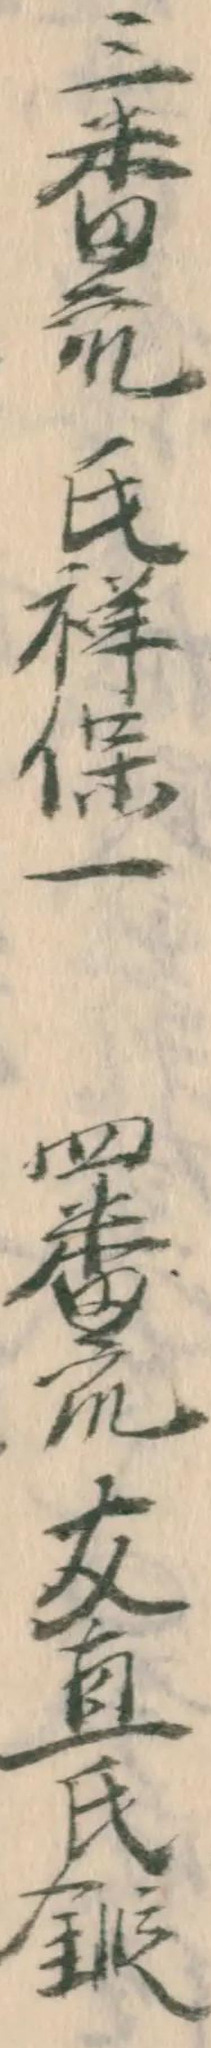三番衆氏祥保一四番衆友直氏鍛
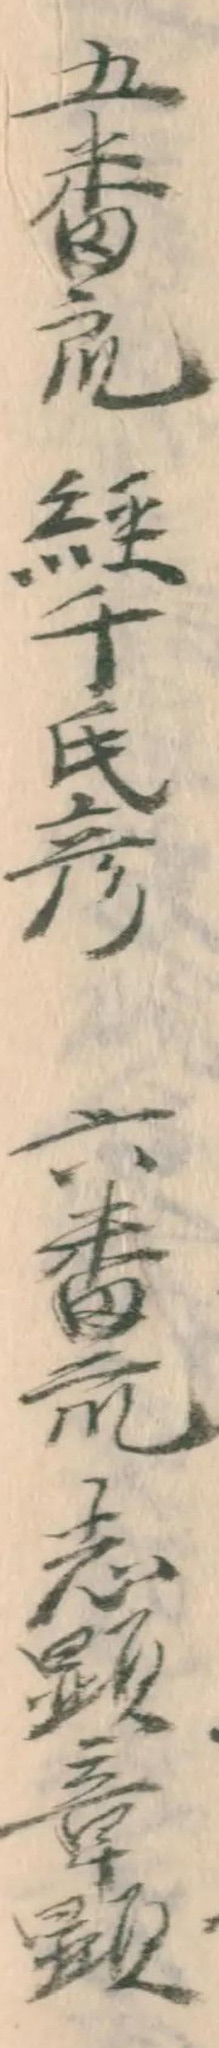五番衆経千氏彦六番衆志顕章顕
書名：賀茂社記録. 第66冊
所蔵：国立国会図書館 National Diet Library, JAPAN
